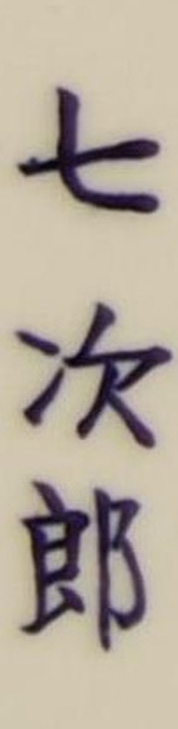七次郎

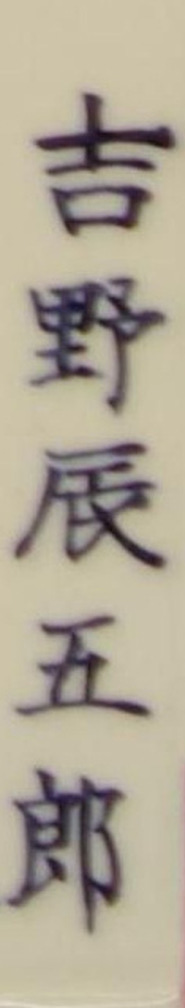吉野辰五郎
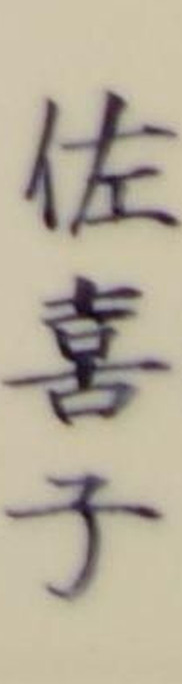佐喜子
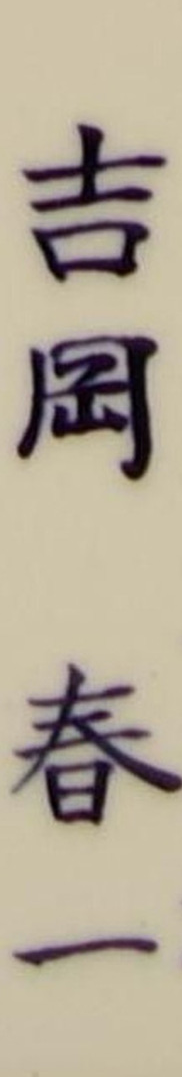吉岡春一
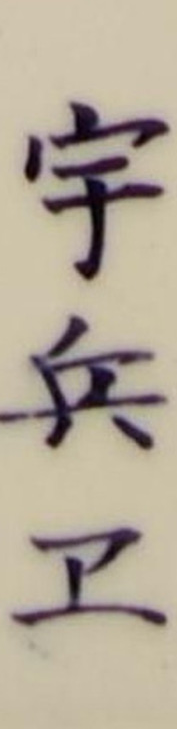宇兵ヱ
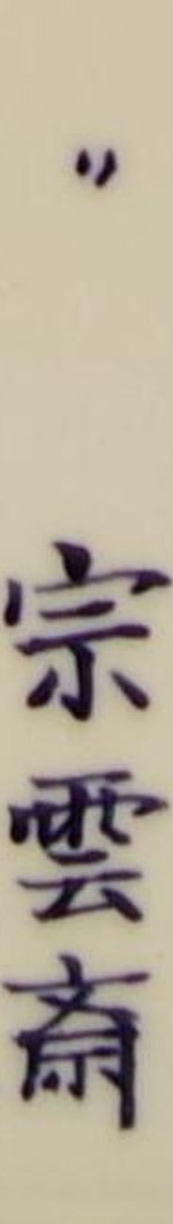宗雲斎
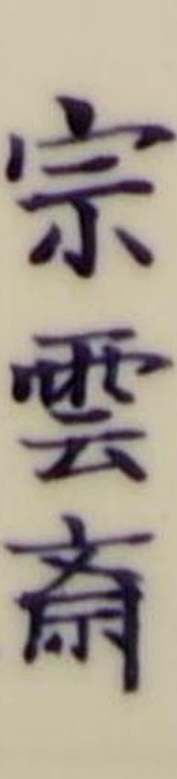宗雲斎
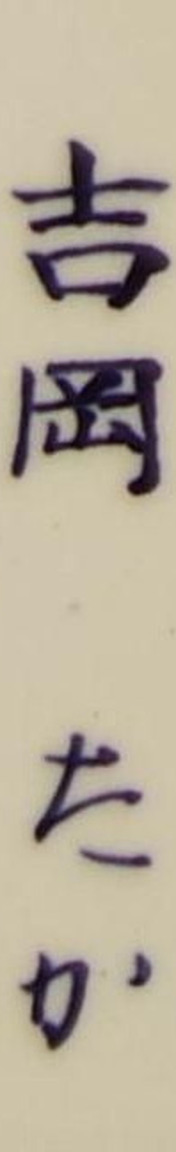吉岡たか
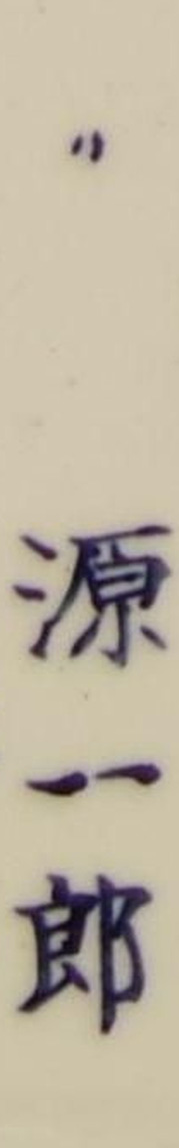源一郎
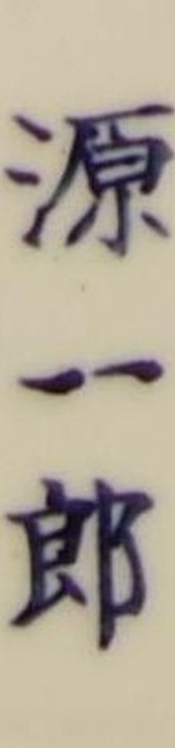源一郎
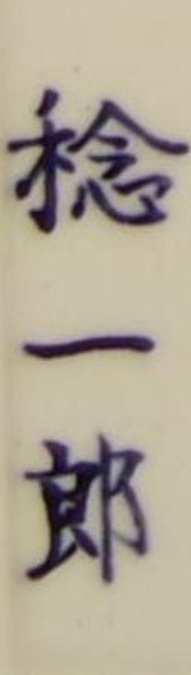稔一郎

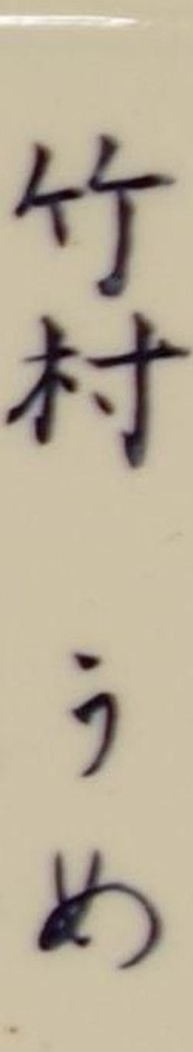竹村かめ
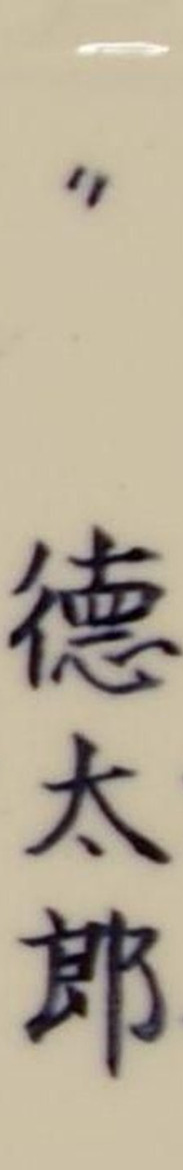徳太郎
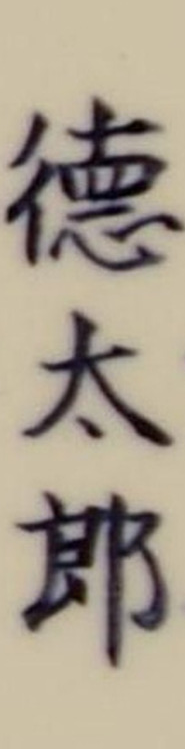徳太郎
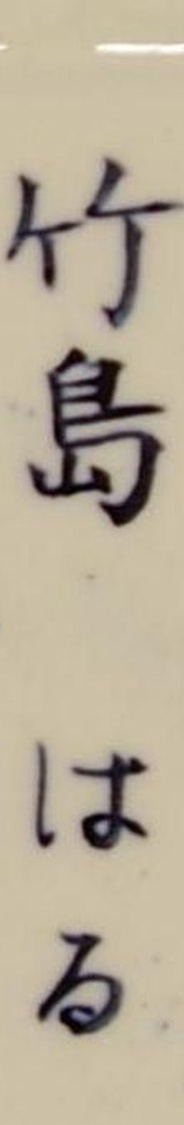竹島はる
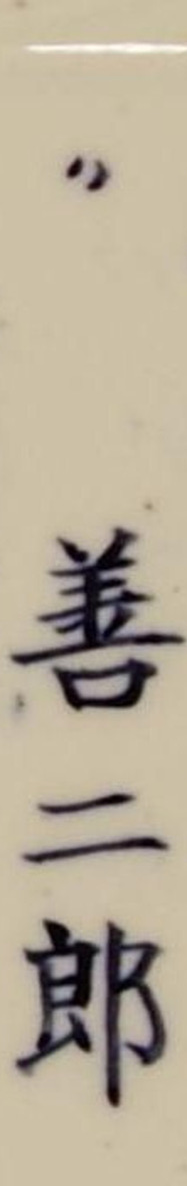善二郎
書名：A~D
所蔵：koyasan kongobuji
